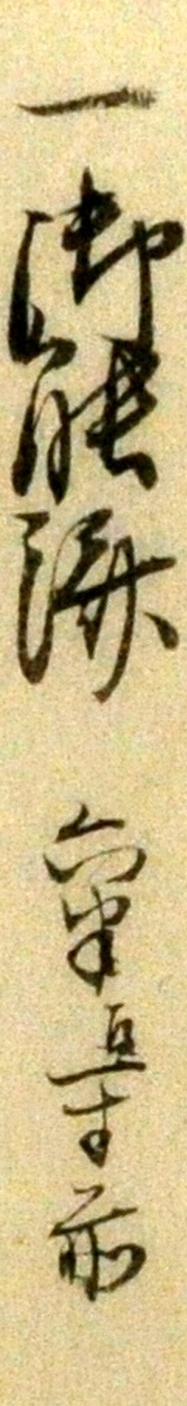一御能済六半え一寸前
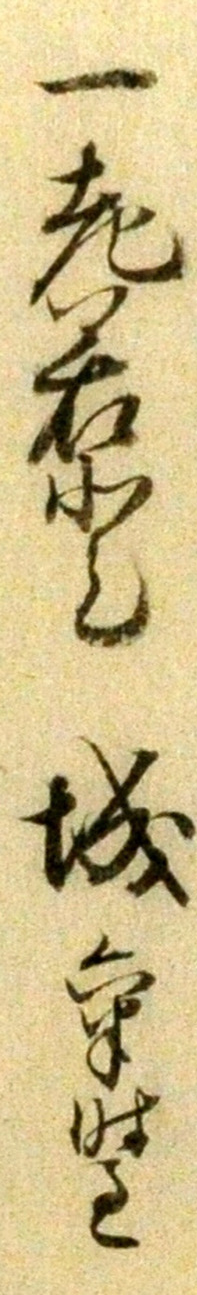一老若登城六半時過
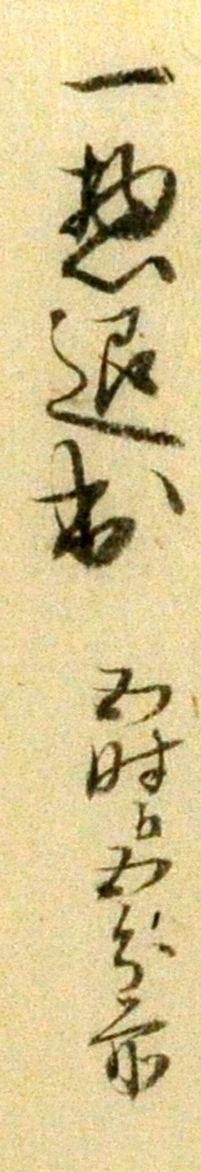一惣退出五時え五分前

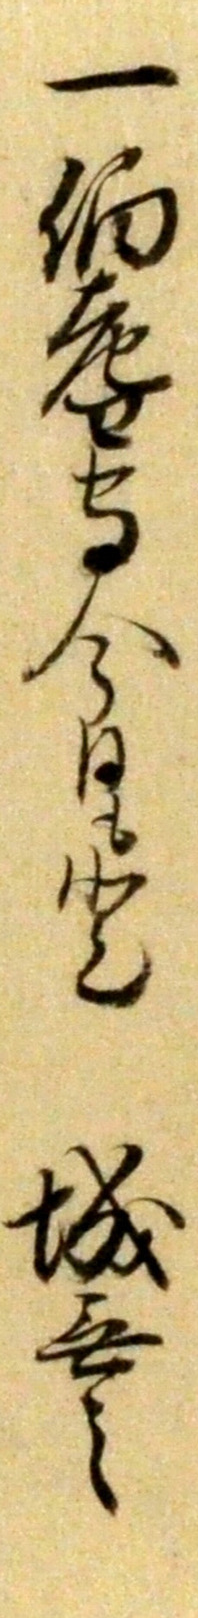一伯耆守今日も登城無之
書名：御馳走御能ノ節ノ留外
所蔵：伊那市立高遠町図書館・合同会社AMANE
